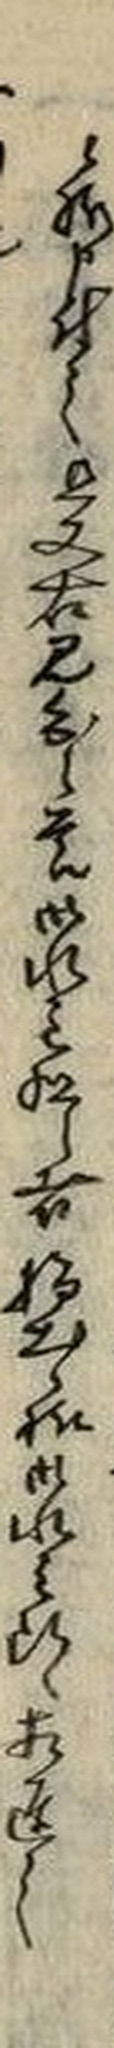候様申付之且又右見分之節御水主組之者指出候様御水主頭へ相達之
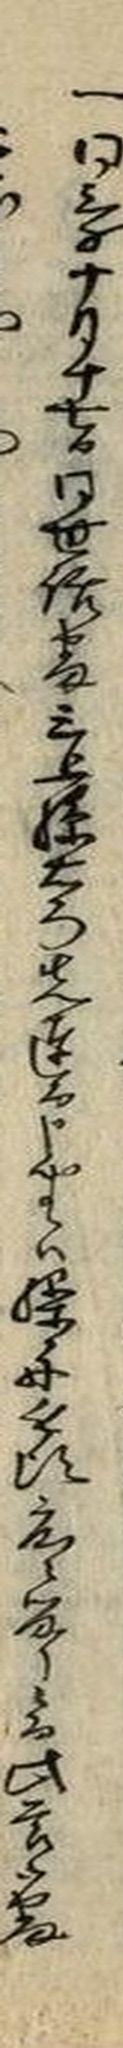一同三刁十月十七日同世話番三上孫右衛門先達て申聞候は繰舟近頃度々留り候て此節御番
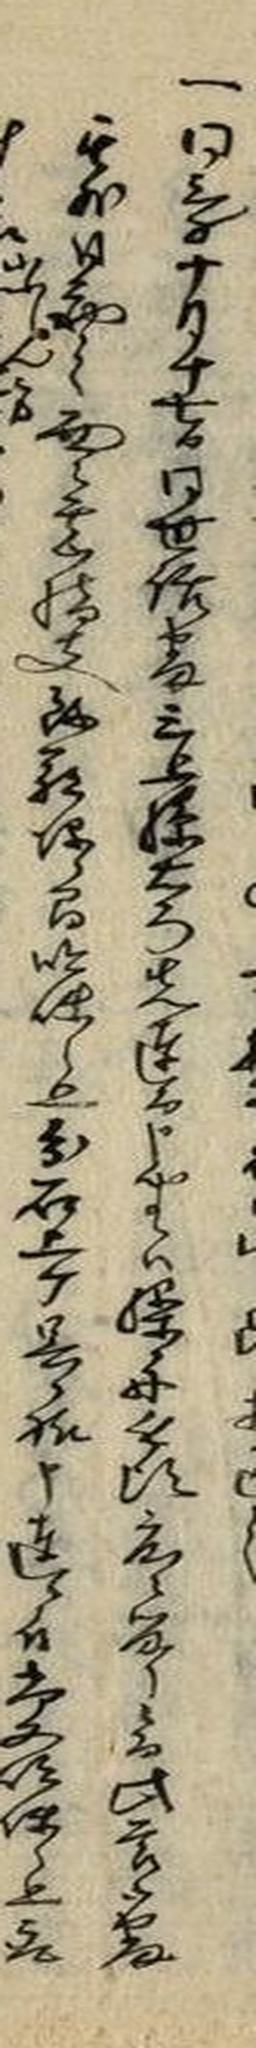其外日勤之面々甚指支致難儀候間吟味之上分石上ケ呉候様申達候に付尚又吟味之上取
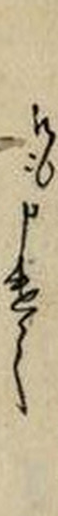えも申遣之
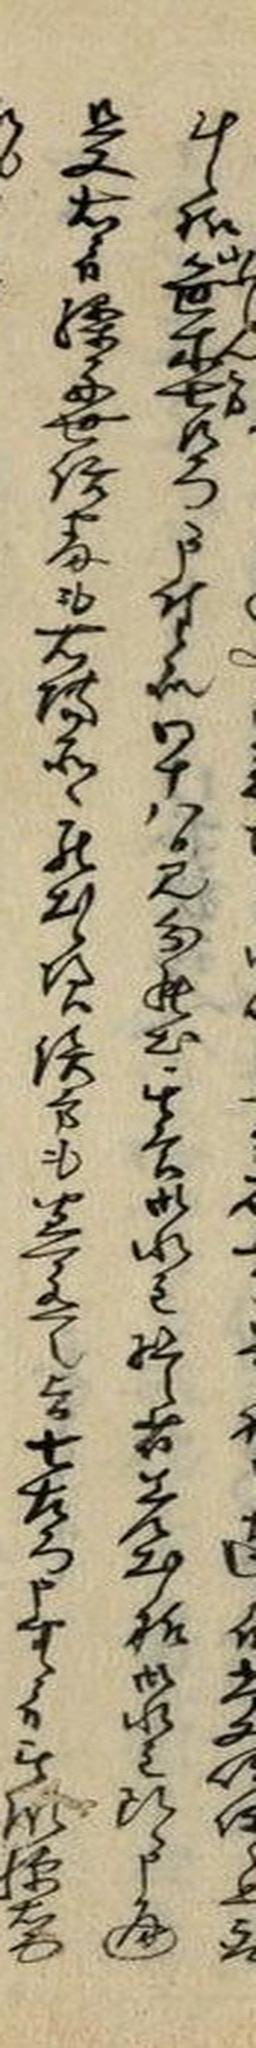且又右に付繰舟世話番も右場所へ罷出候得は談方も宜可有之旨七左衛門申聞候に付其段孫右衛門
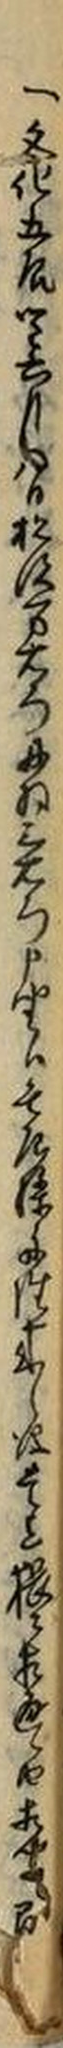一文化五辰閏六月八日松沢万右衛門丹羽三右衛門申聞候は毛屋繰舟往来之儀是迄猥に相通候由相聞候間
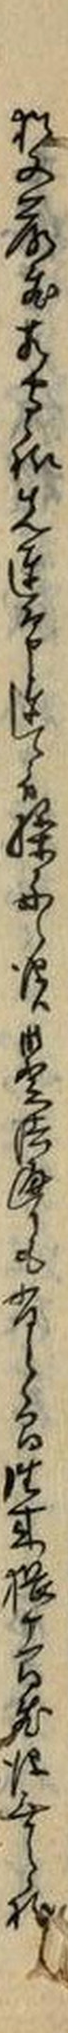猶又厳敷相守候様先達て申達候に付繰舟之儀は御定法通りも有之候間往来猥ケ間敷儀無之様
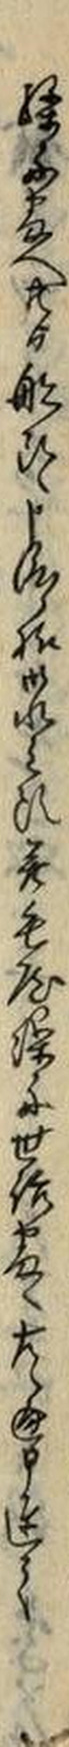繰舟番人共ゟ船頭へ申渡候様御水主頭并毛屋繰舟世話番へ左之通申達之
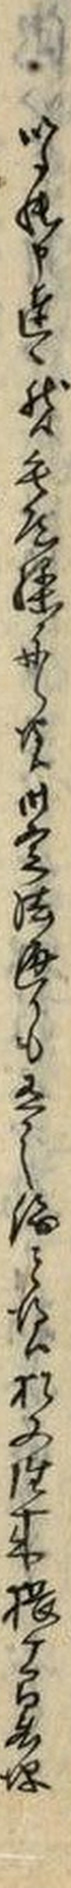以手紙申達候然は毛屋繰舟之儀は御定法通りも有之儀に候得は猶又往来猥ケ間敷儀
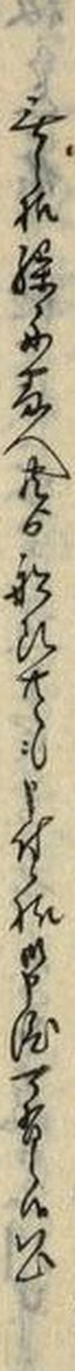無之様繰舟番人共ゟ船頭共へも申付候様御申渡可有之候以上
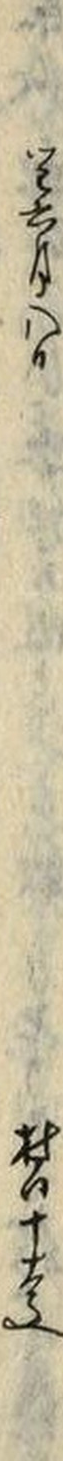閏六月八日村田十大夫
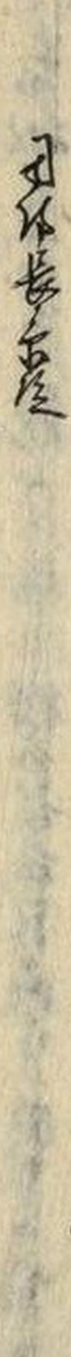周防長兵衛殿
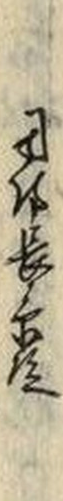周防長兵衛殿
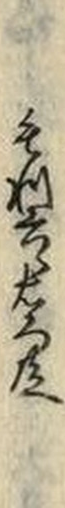毛利六郎右衛門殿
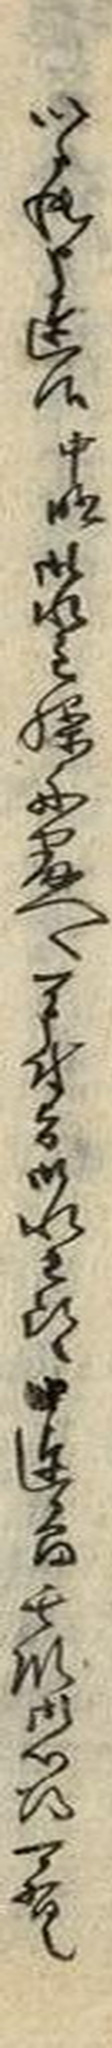以手紙申達候中略御水主繰舟番人へ可申付旨御水主頭へ申達候間其段御心得可有之
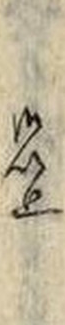候以上
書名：御城下諸事之部
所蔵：福井県文書館 Fukui Prefectural Archives
